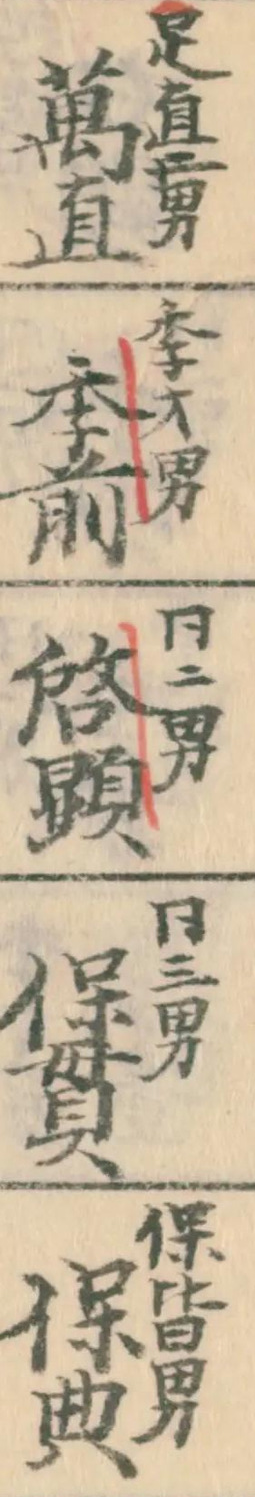萬直季前啓顕保貫保典

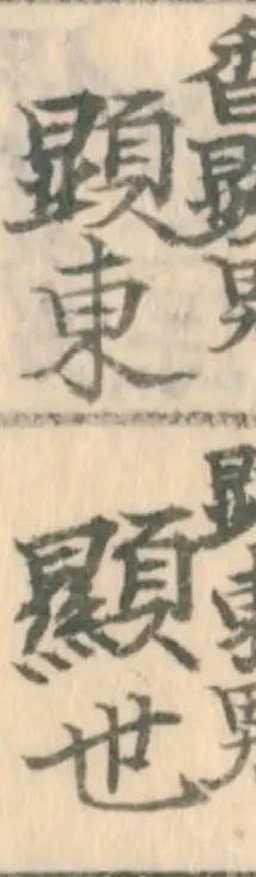顕東顕世
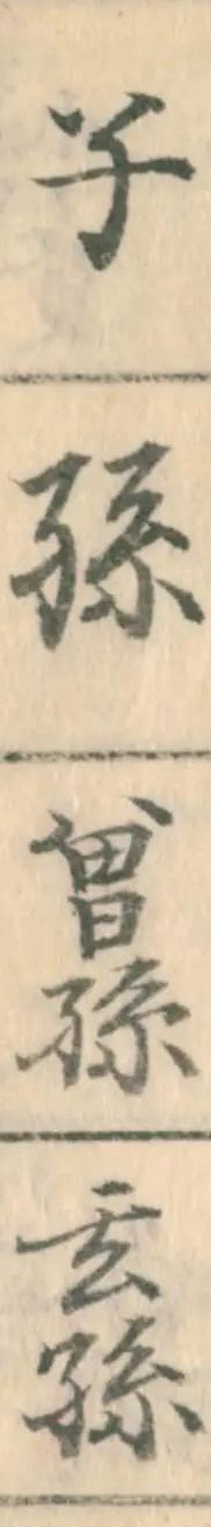子孫曽孫玄孫
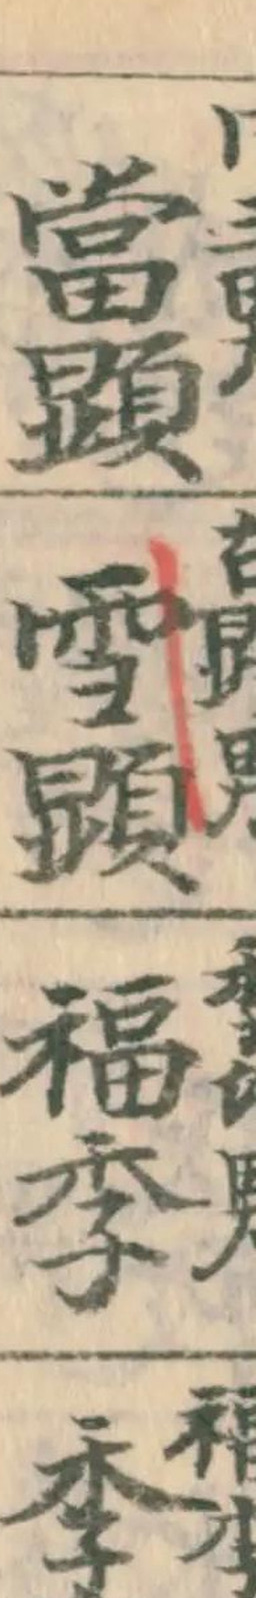當顕雪顕福季季龍
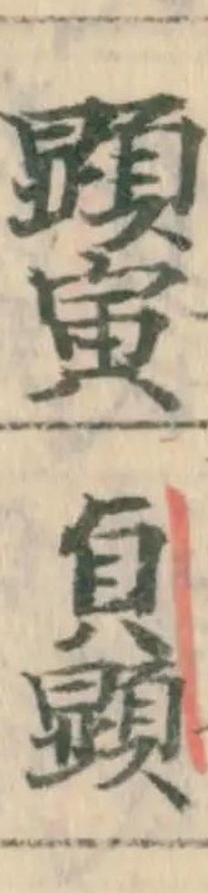顕寅貞顕

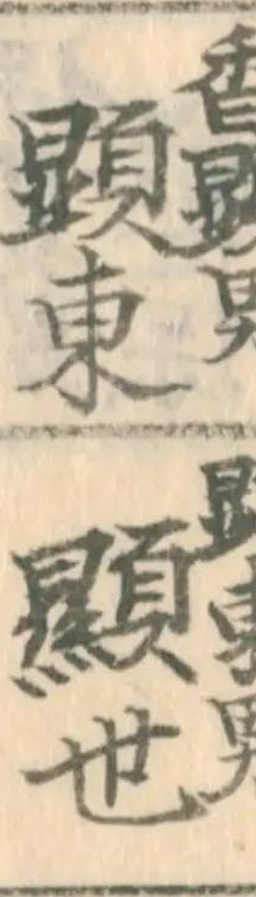顕東顕世
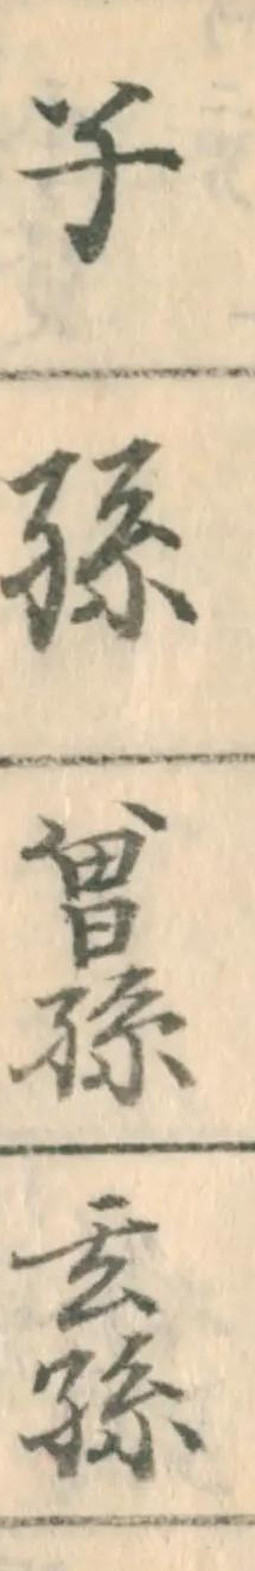子孫曽孫玄孫
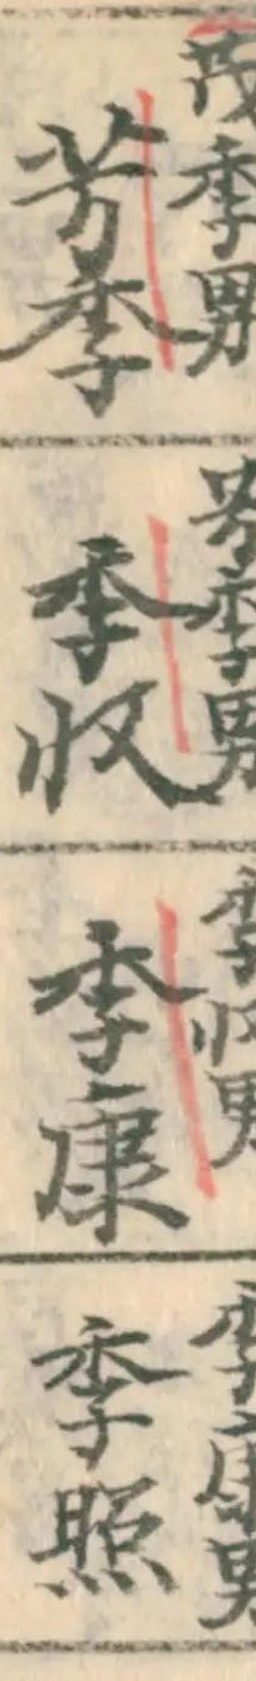芳季季収季康季照
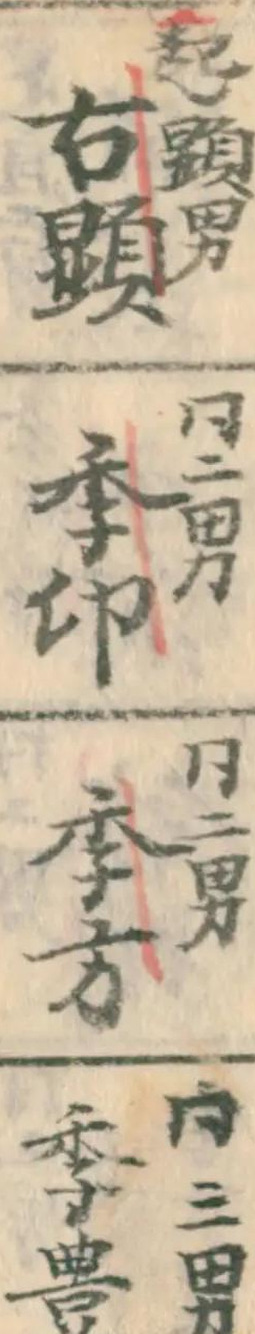右顕季卬季方季豊
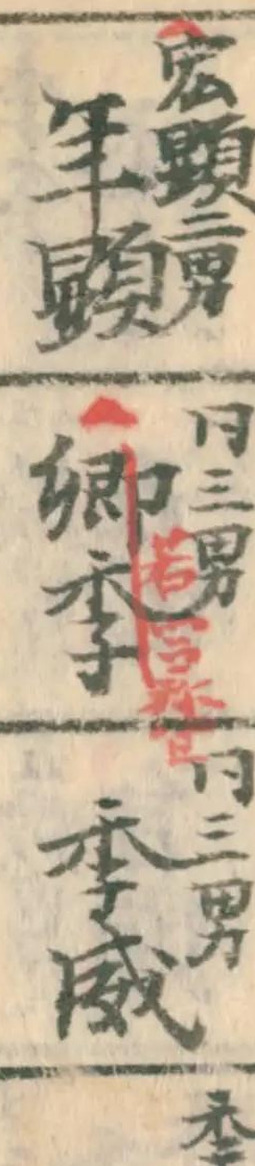年顕▲卿季季威
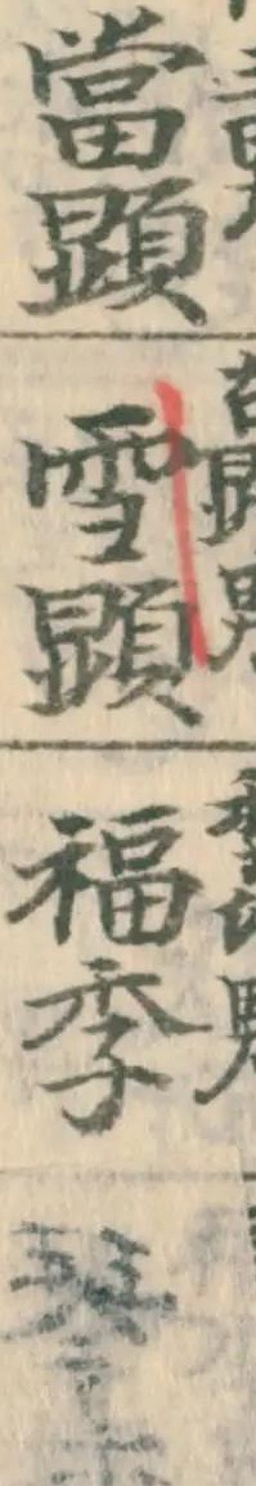當顕雪顕福季
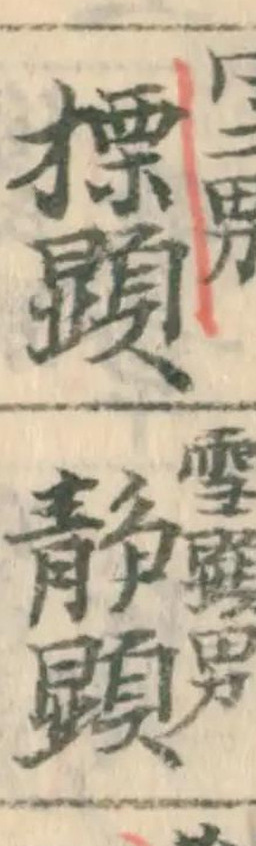標顕静顕
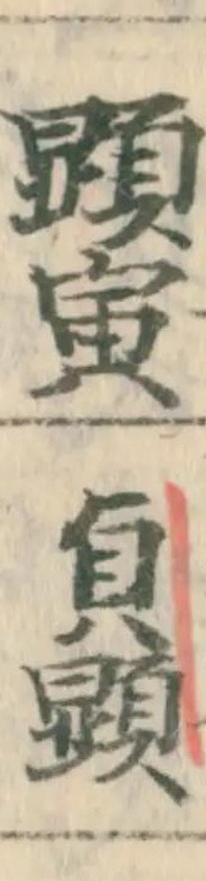顕寅貞顕

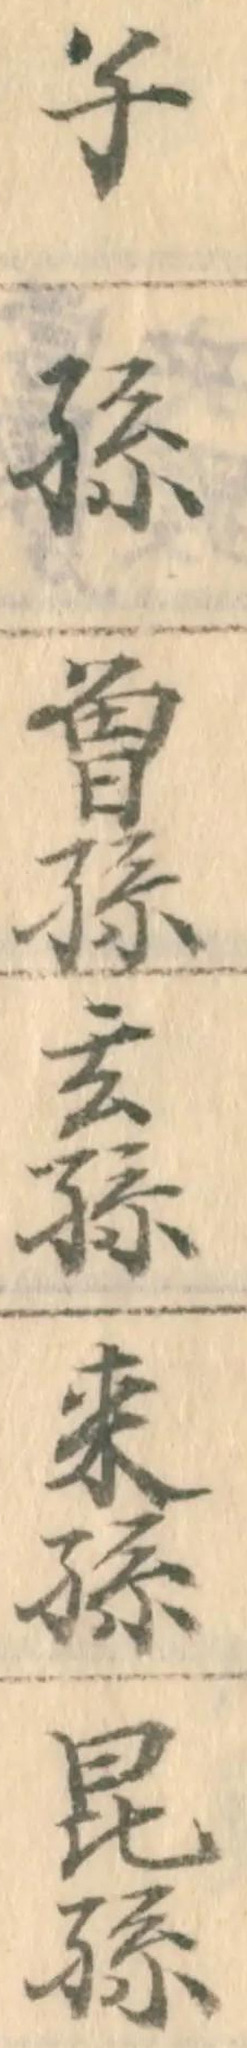子孫曽孫玄孫来孫昆孫
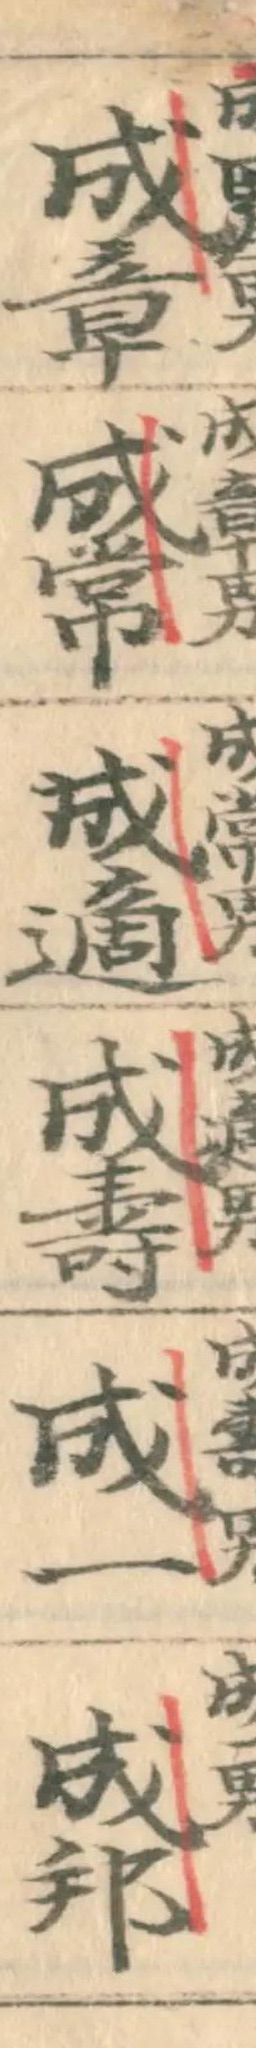成章成常成適成壽成一成邦
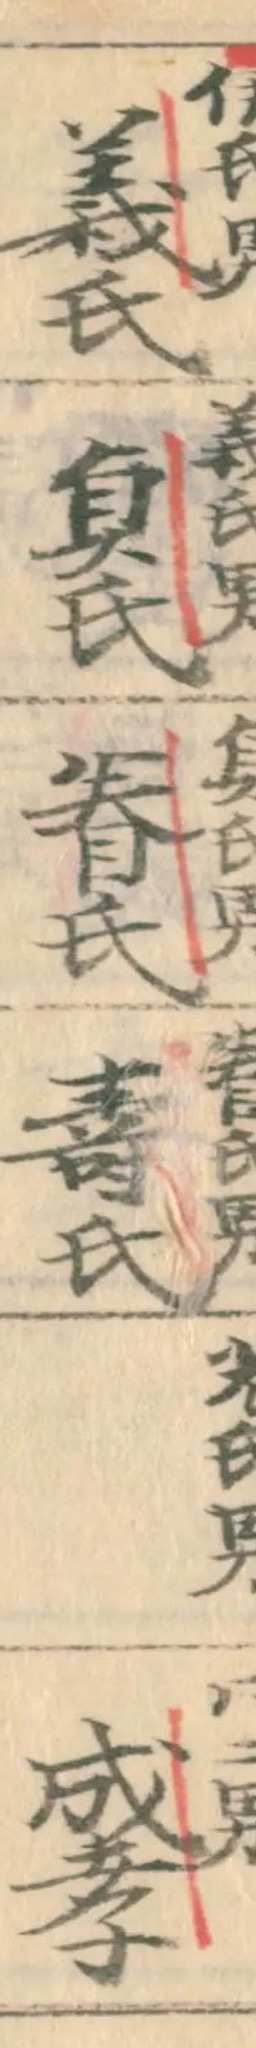義氏貞氏眷氏壽氏成孝
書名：賀茂社記録. 第24冊
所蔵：国立国会図書館 National Diet Library, JAPAN
